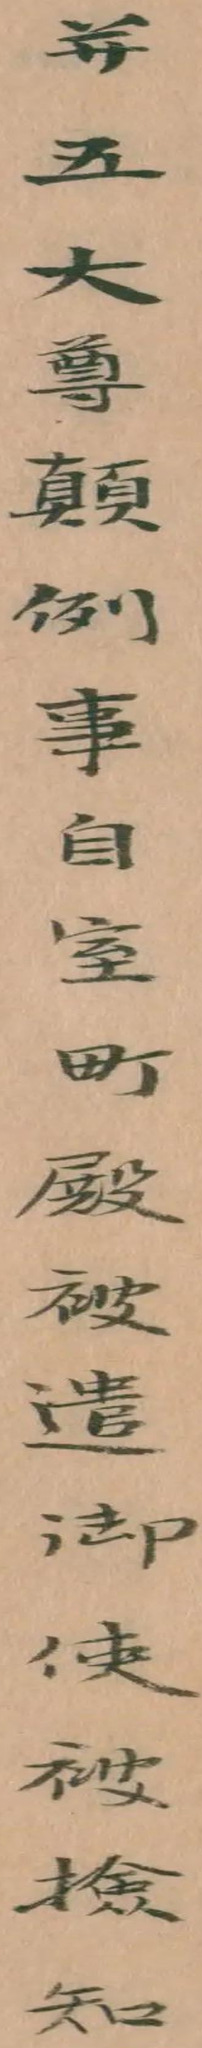幷五大尊顛倒事自室町殿被遣御使被検知
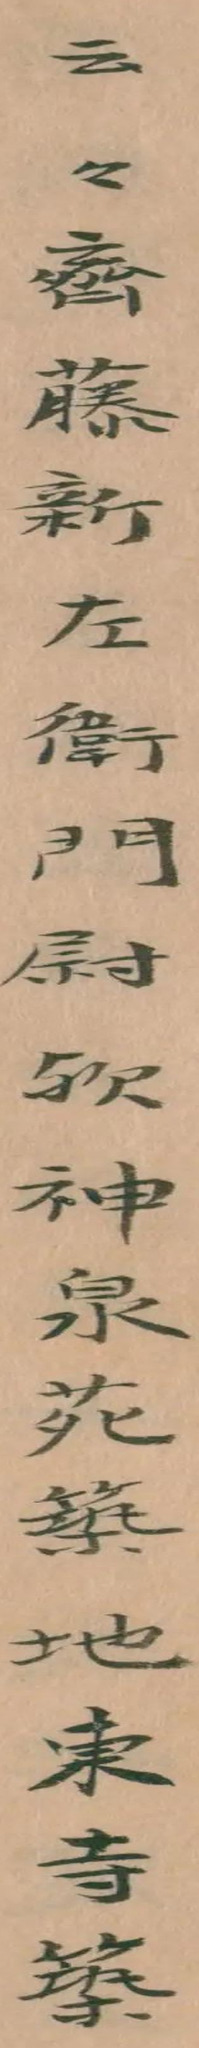云々斉藤新左衛門尉歟神泉苑築地東寺築
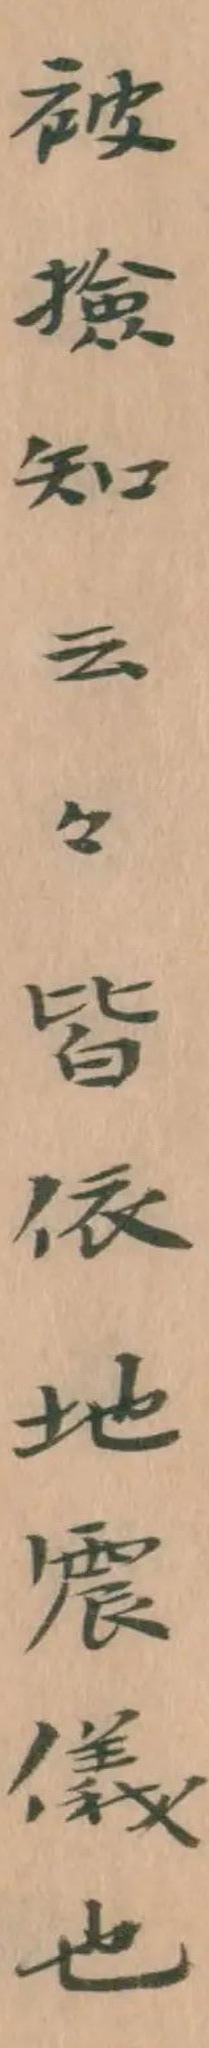被検知云々皆依地震儀也
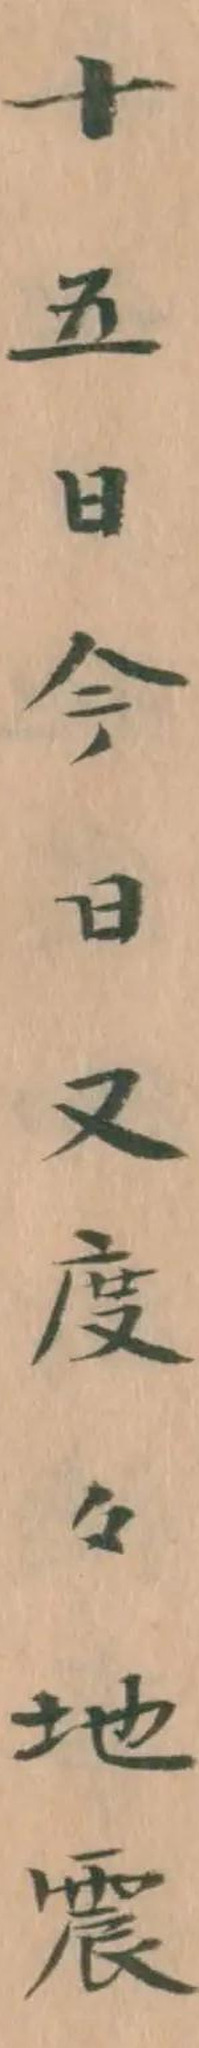十五日今日又度々地震

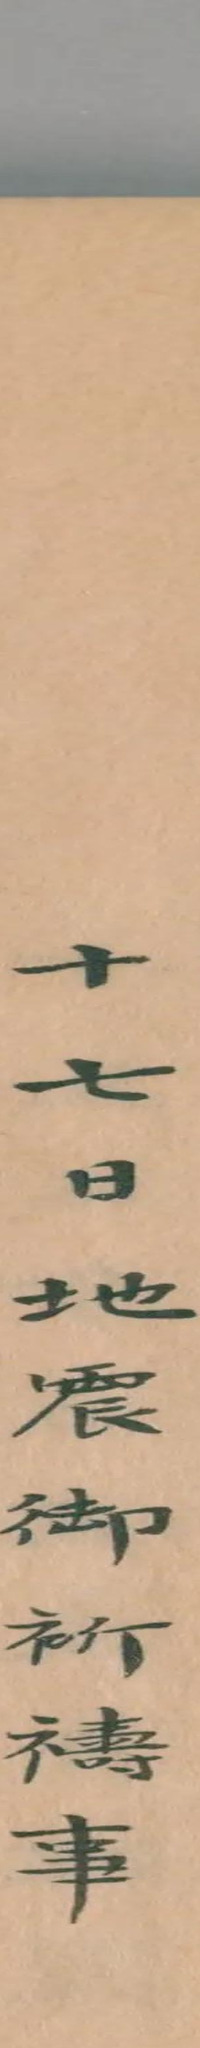十七日地震御祈祷事
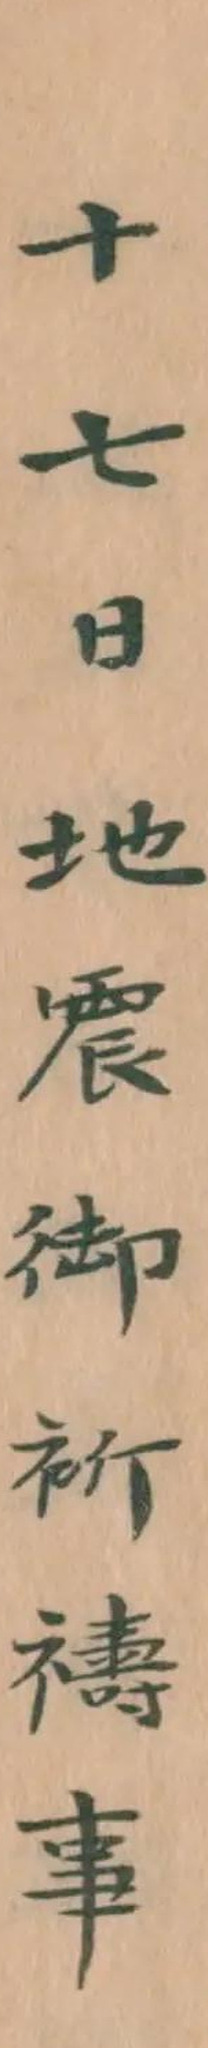十七日地震御祈祷事
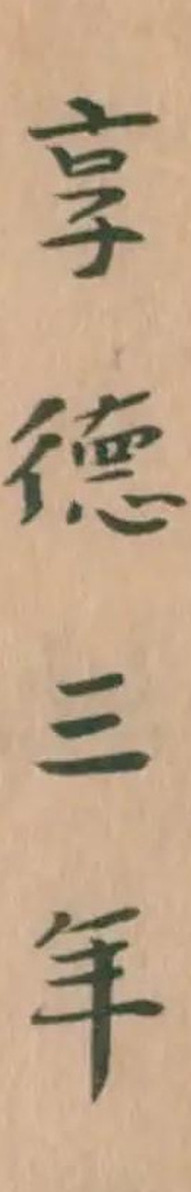享徳三年
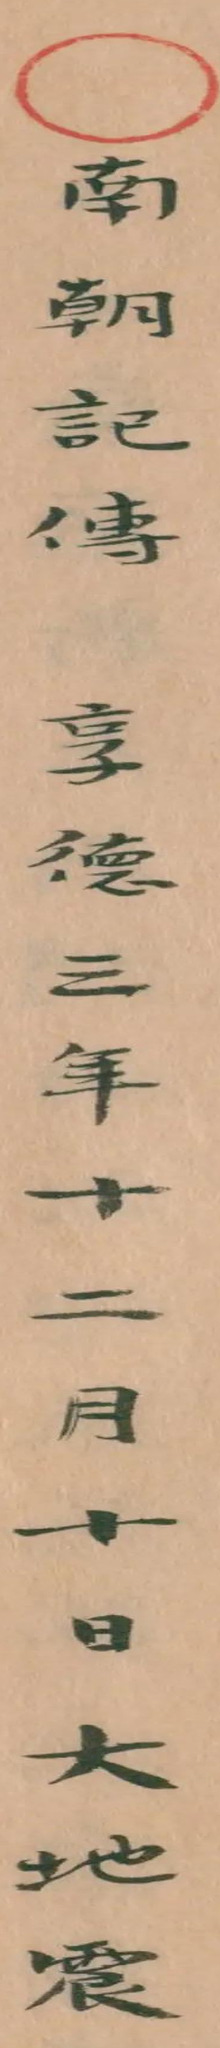○南朝記伝享徳三年十二月十日大地震
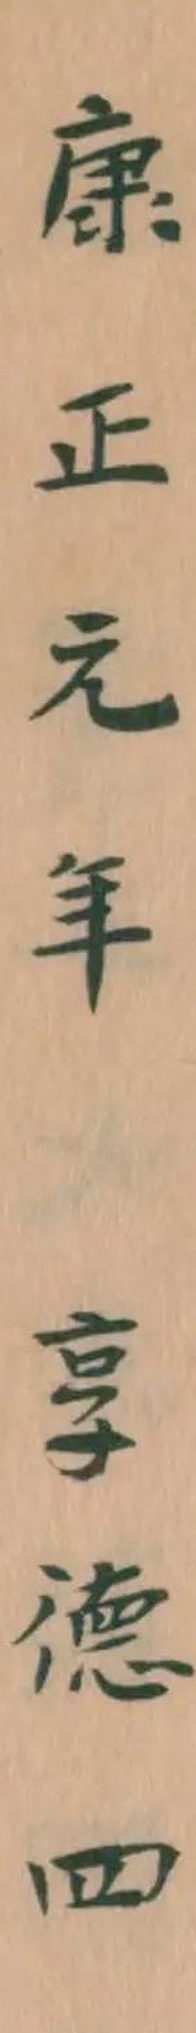康正元年享徳四年
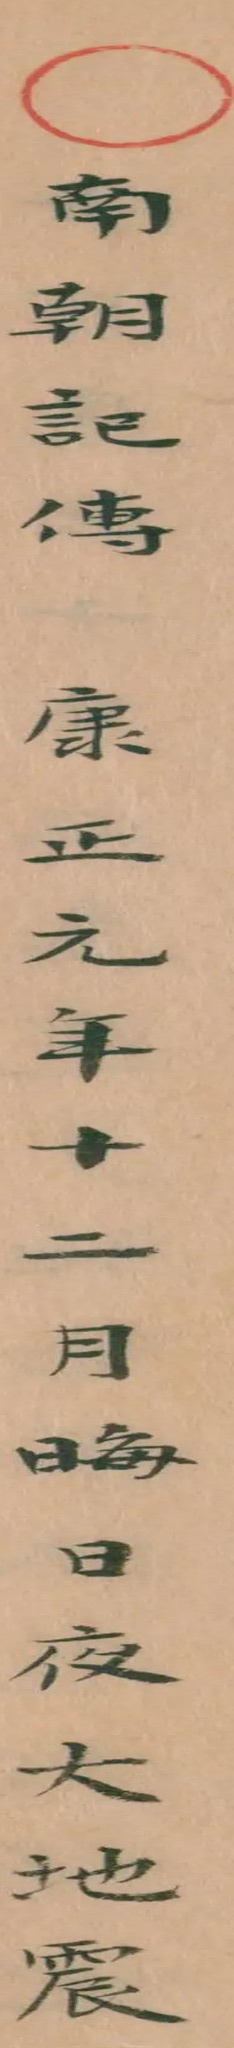○南朝記伝康正元年十二月晦日夜大地震
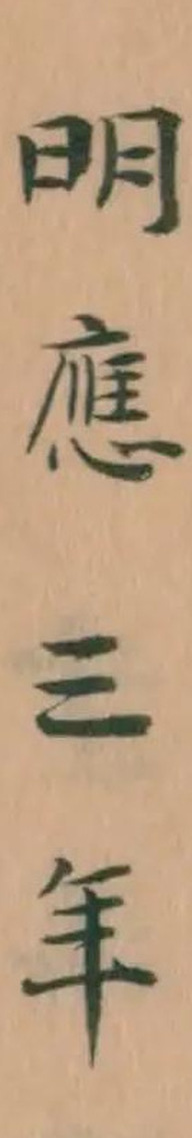明応三年
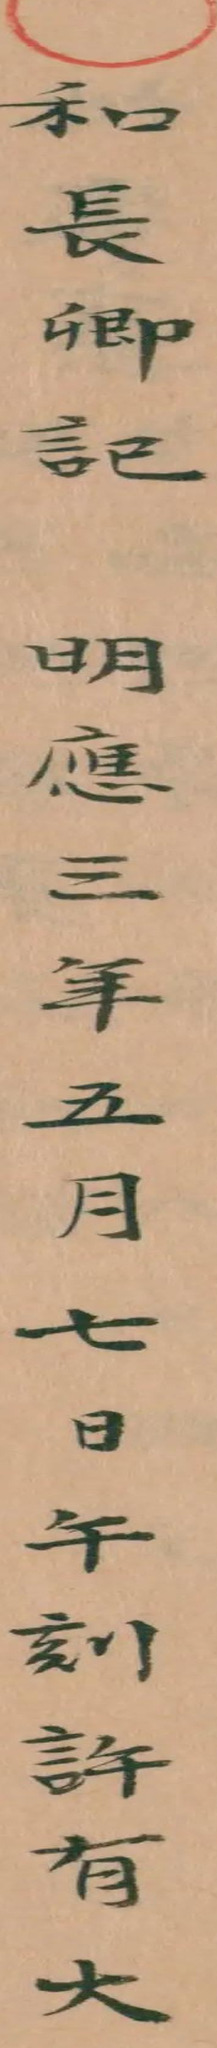○和長卿記明応三年五月七日午刻許有大
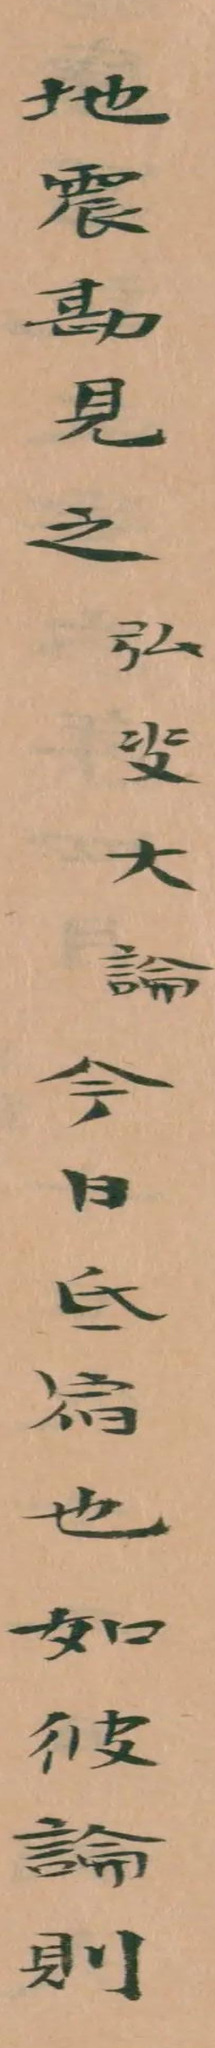地震勘見之弘斐大論今日氐宿也如彼論則
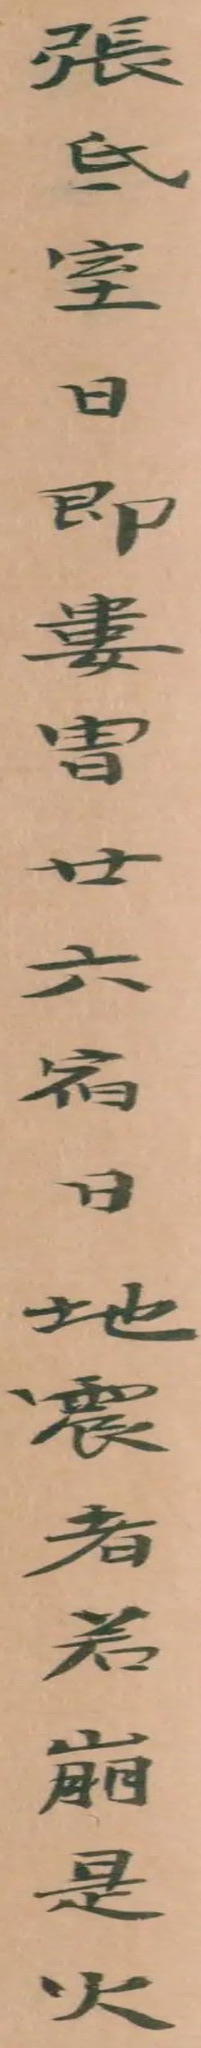張氐室日即婁胄廿六宿日地震者若崩是火
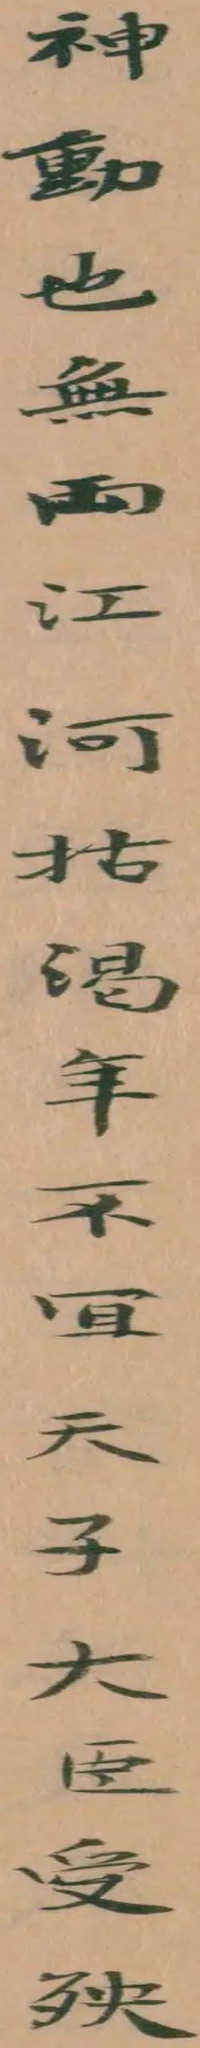神動也無両江河枯渇年不宜天子大臣受殃
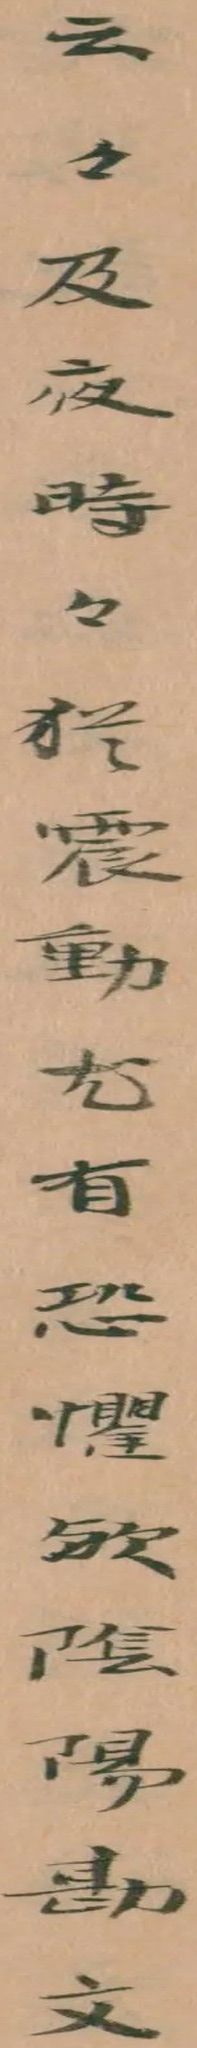云々及夜時々猶震動尤有恐懼歟陰陽勘文
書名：地災撮要. 巻5-6(地震之部)
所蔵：国立国会図書館 National Diet Library, JAPAN
